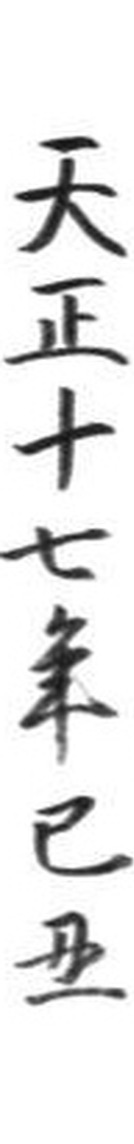天正十七年己丑
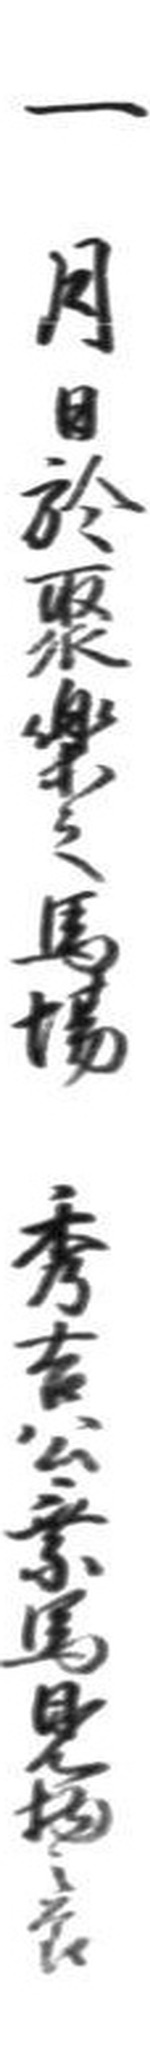一月日於聚楽之馬場秀吉公乗馬見物之節
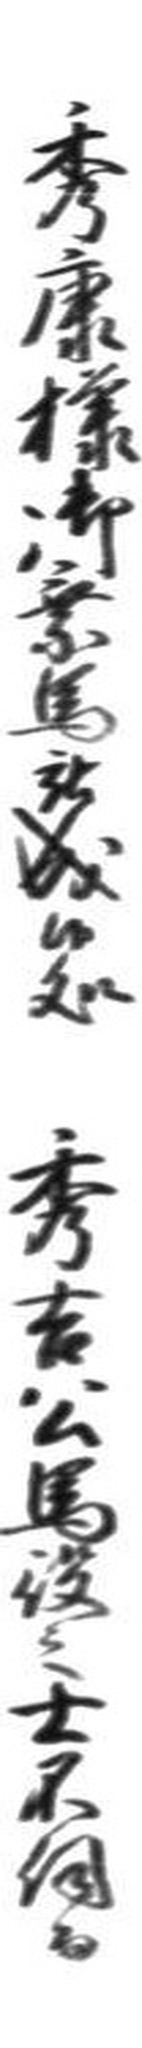秀康様御乗馬被成候処秀吉公馬役之士不伺而
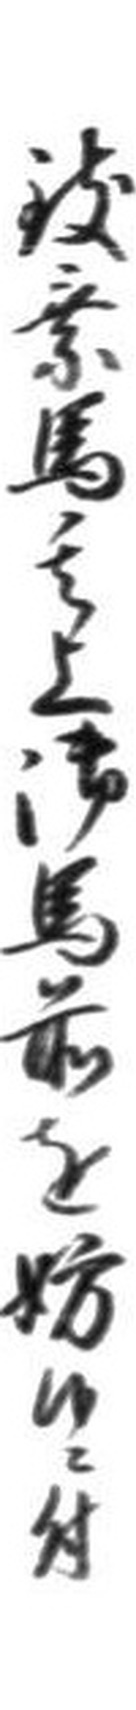致乗馬其上御馬前を妨候に付
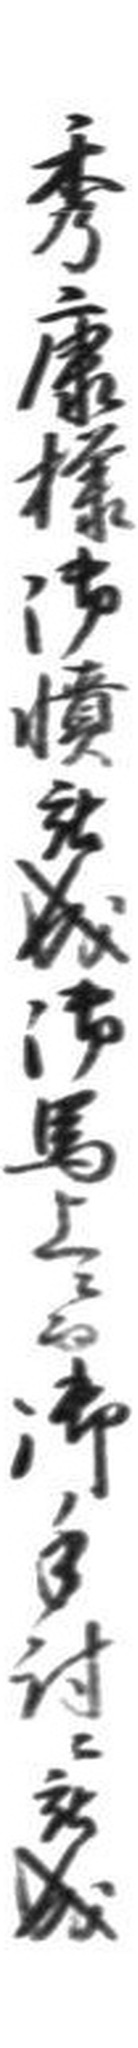秀康様御憤被成御馬上に而御手討に被成
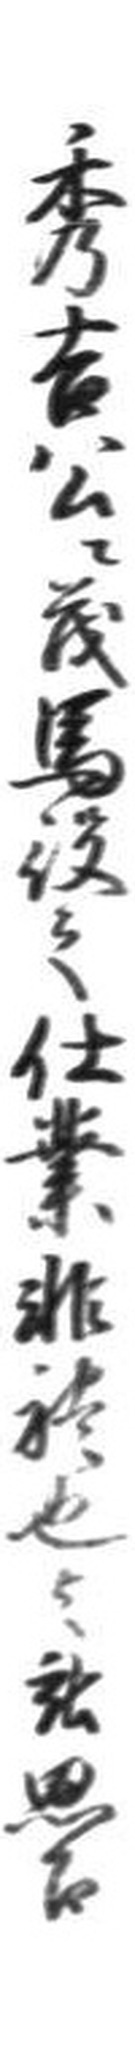秀吉公にも馬役之仕業非礼也と被思召
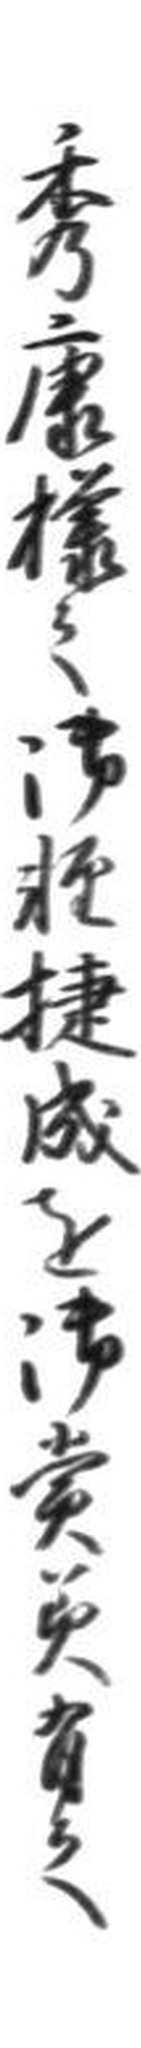秀康様之御軽捷成を御賞美有之

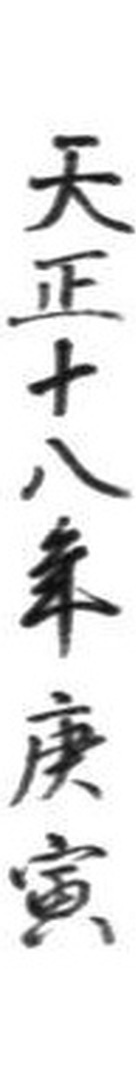天正十八年庚寅
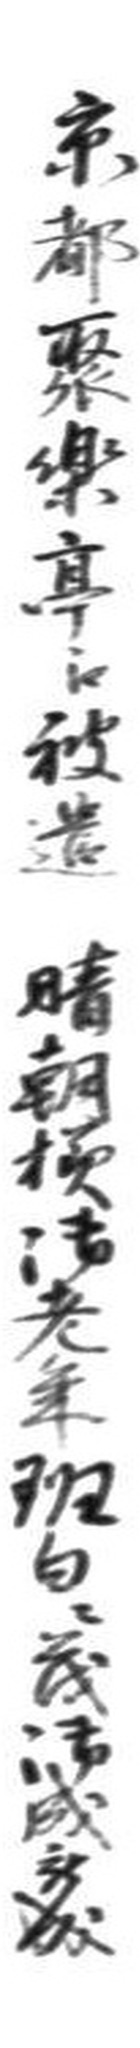京都聚楽亭江被遣晴朝様御老年班白にも御成被成
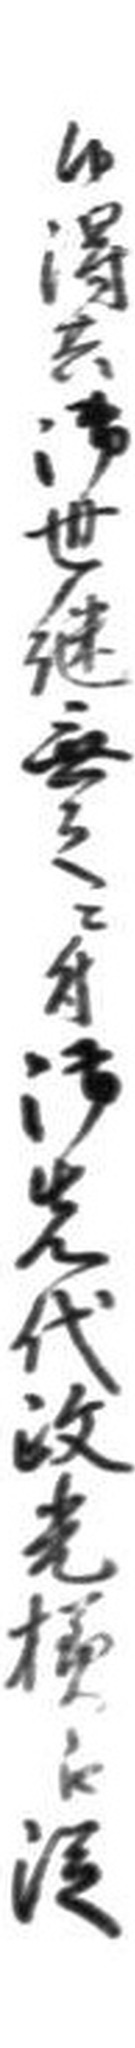候得共御世継無之に付御先代政光様江従
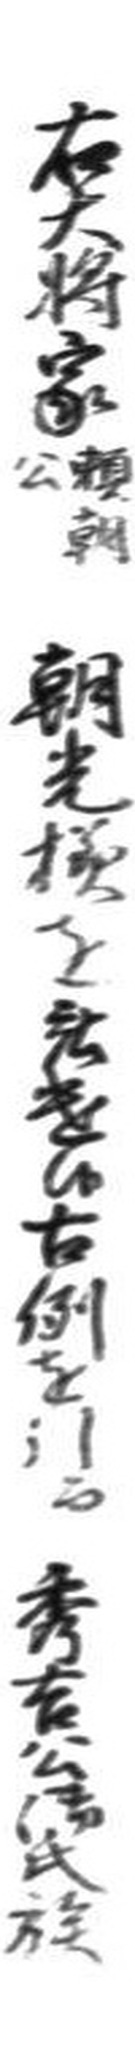右大将家頼朝公朝光様を被遣候古例を引而秀吉公御氏族
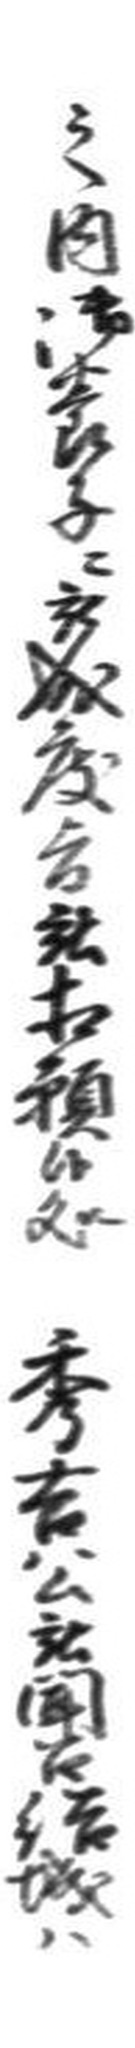之内御養子に被成度旨被相願候処秀吉公被聞召結城は
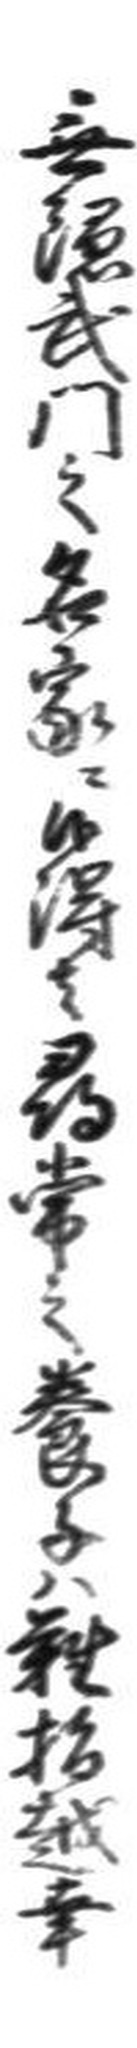無隠武門之名家ニ候得は尋常之養子は難指越幸
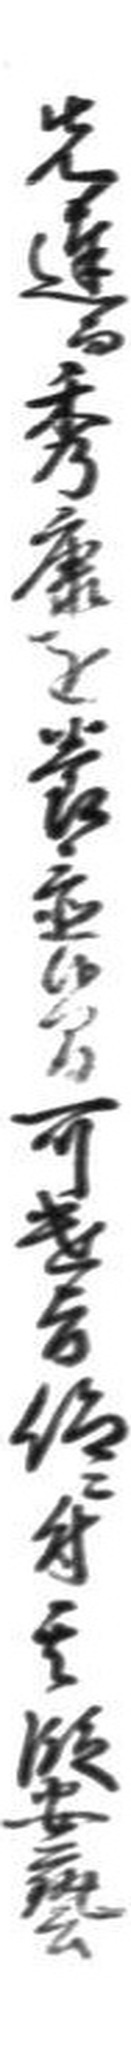先達而秀康を養置候間可遣旨仰ニ付其段安芸
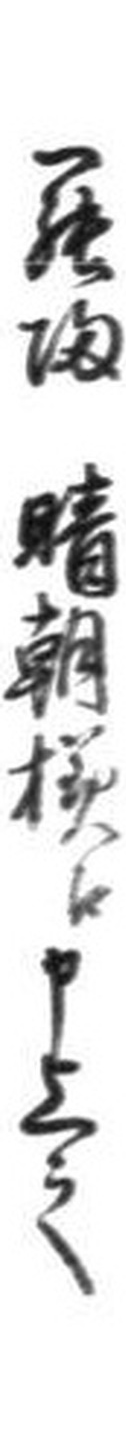罷帰晴朝様江申上之

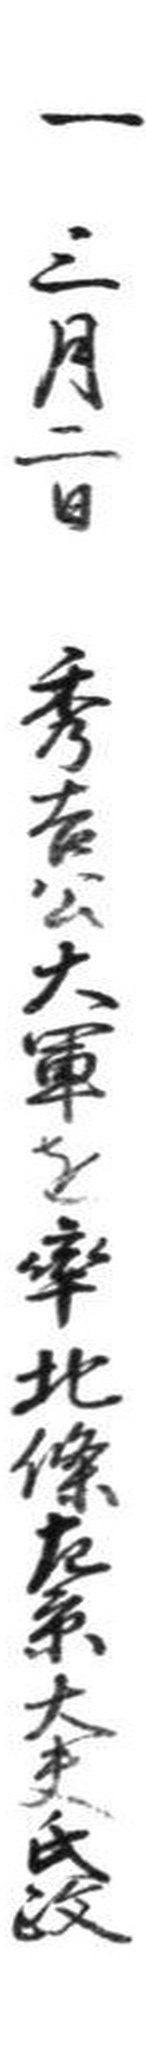一三月二日秀吉公大軍を率北条左京大夫氏政
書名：家譜 一 秀康公 従天正二年到慶長十二年
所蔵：福井県文書館 Fukui Prefectural Archives
